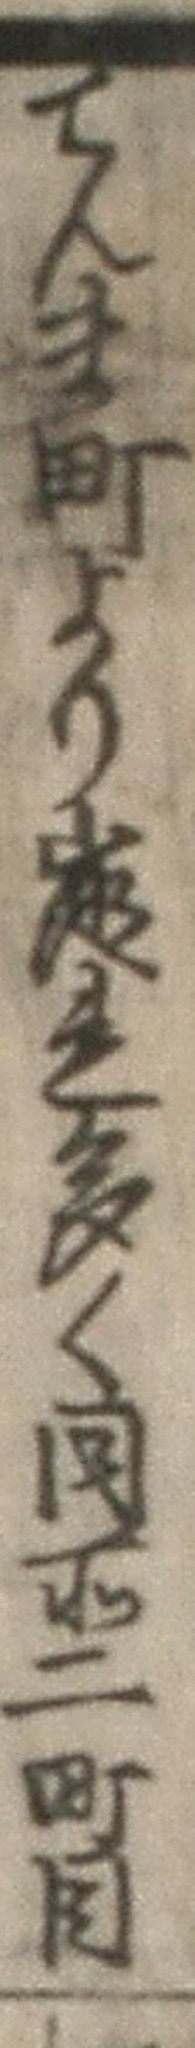てんま町より崩れ多く同所二町目
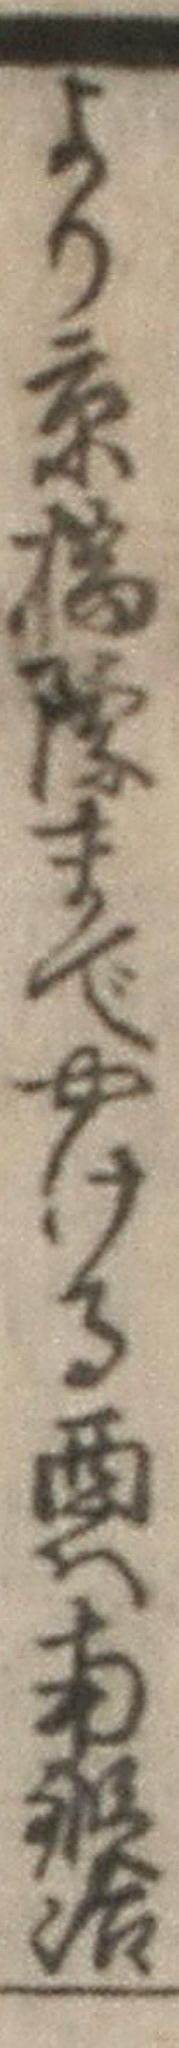より京橋際までやける西は南鍛冶
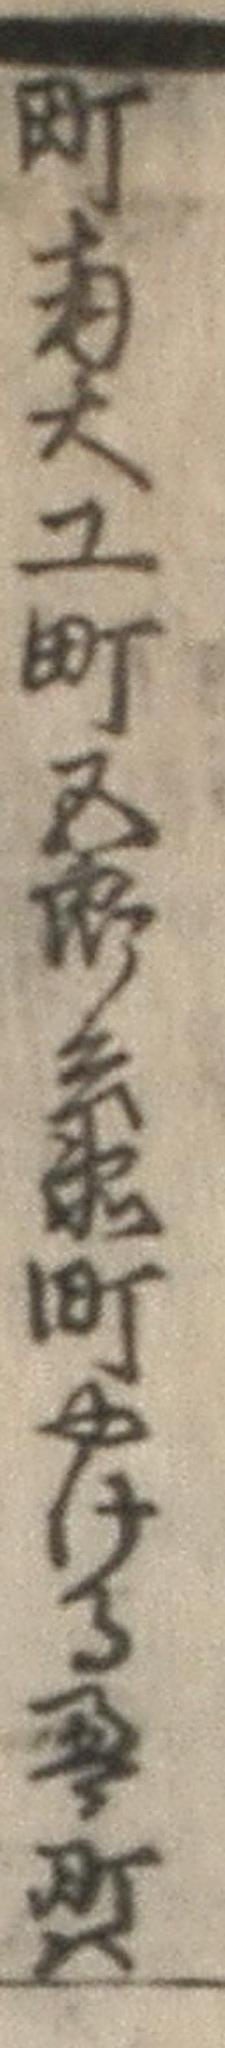町南大工町五郎兵衛町やける畳町は
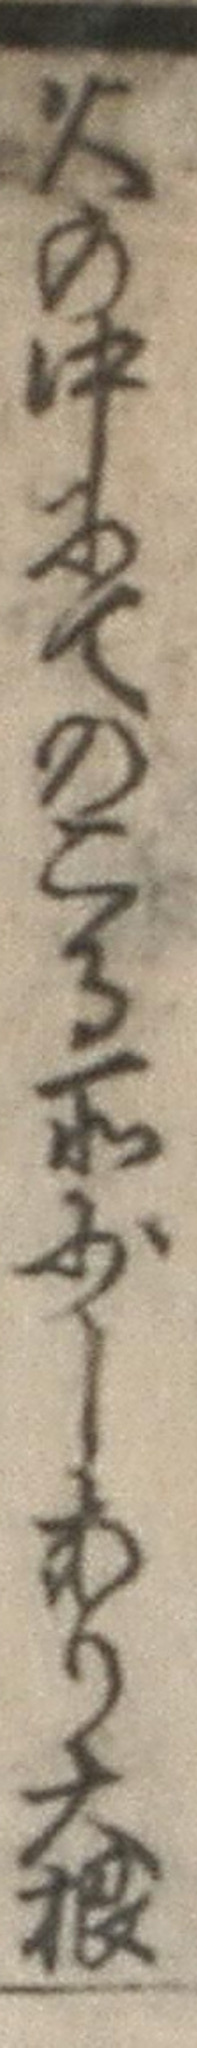火の中にてのこる所少しあり大根
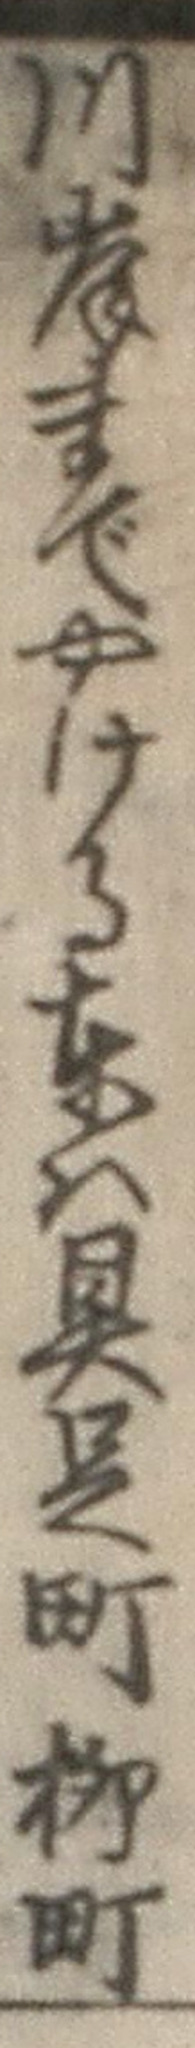川岸までやける東は具足町柳町
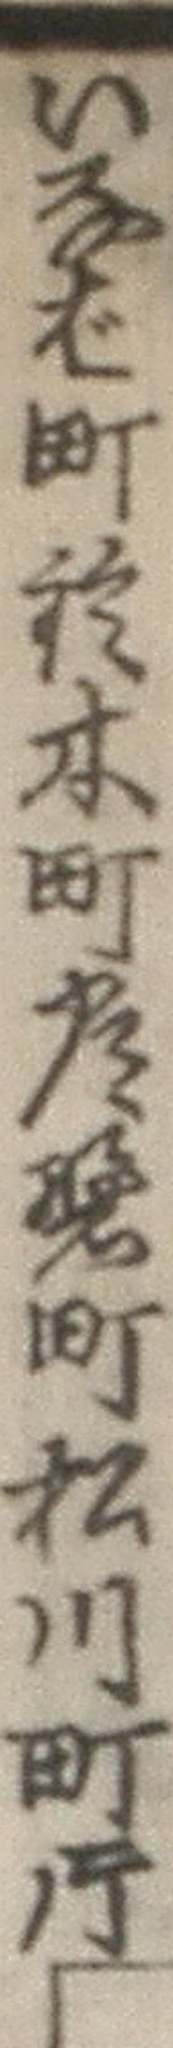おなば町鈴木町常磐町松川町片
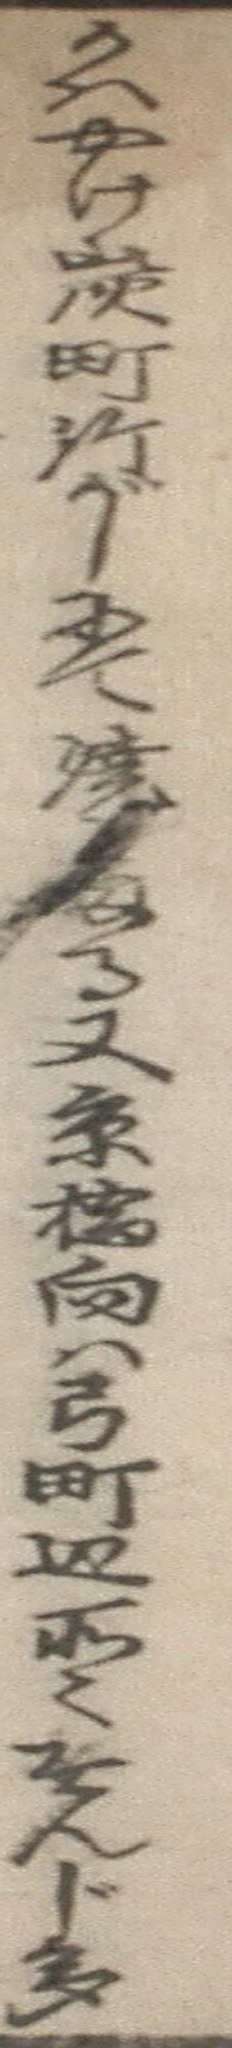かはやけ炭町竹がしにて焼とまる又京橋向は弓町辺所〻そんじ多
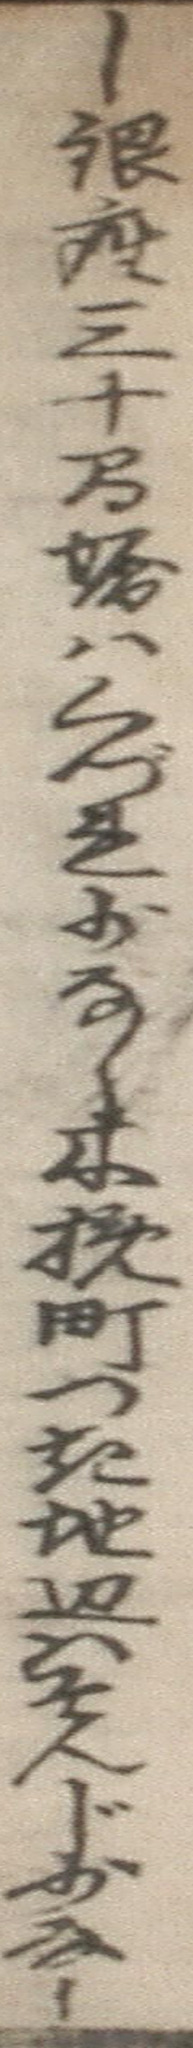し銀座三十間堀はくづれ少なし木挽町つき地辺はそんじ少なし
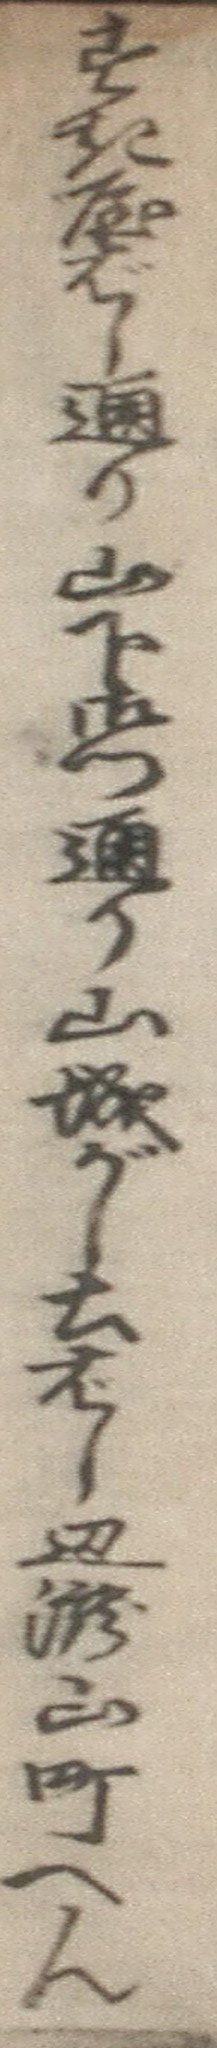すき屋ばし通り山下御門通り山城がし土ばし辺瀧山町へん
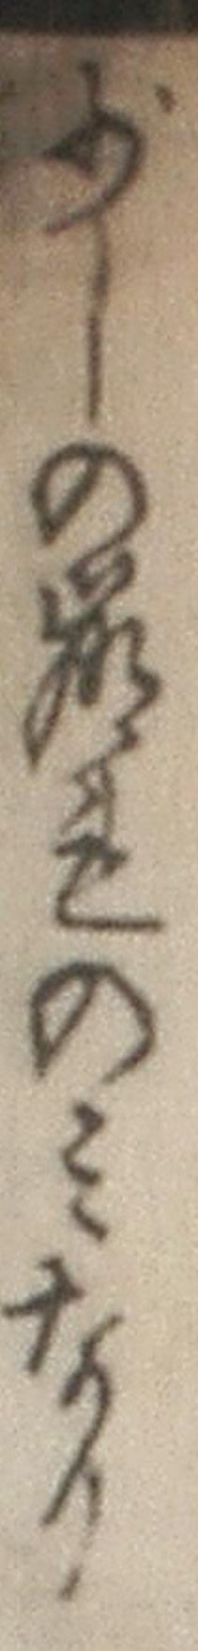少しの崩れのみなり
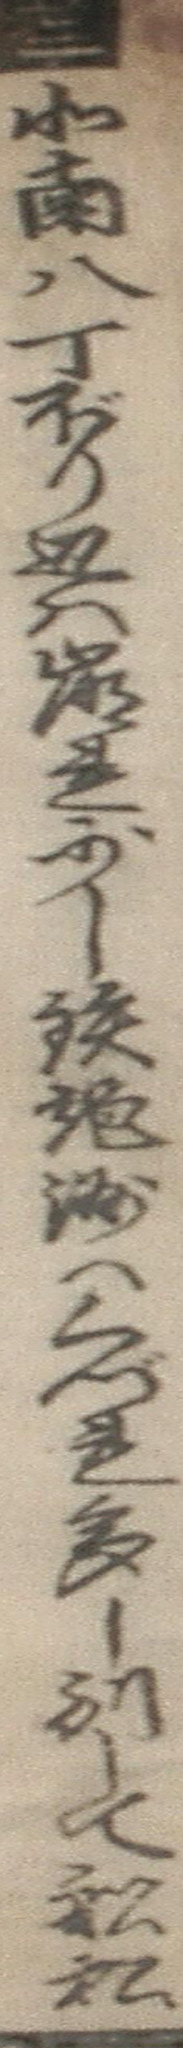廿二北南八丁ぼり辺は崩れ少し鉄砲洲はくづれ多し別して船松
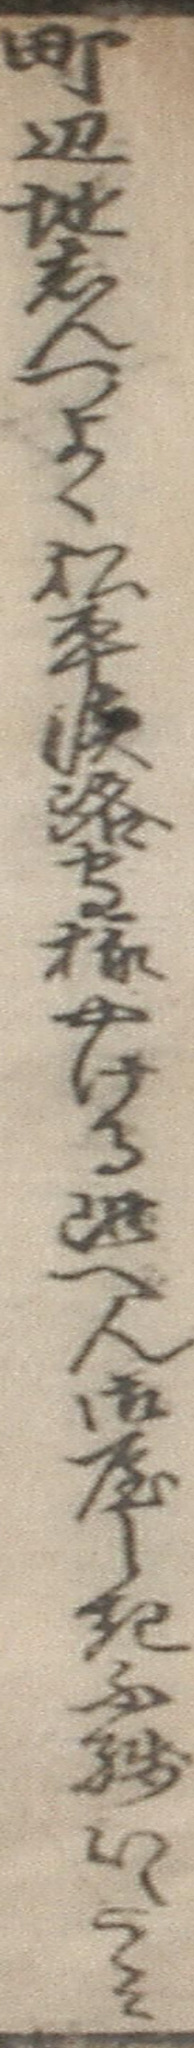町辺地しんつよく松平淡路守様やける此へん御屋しき不残いたみ
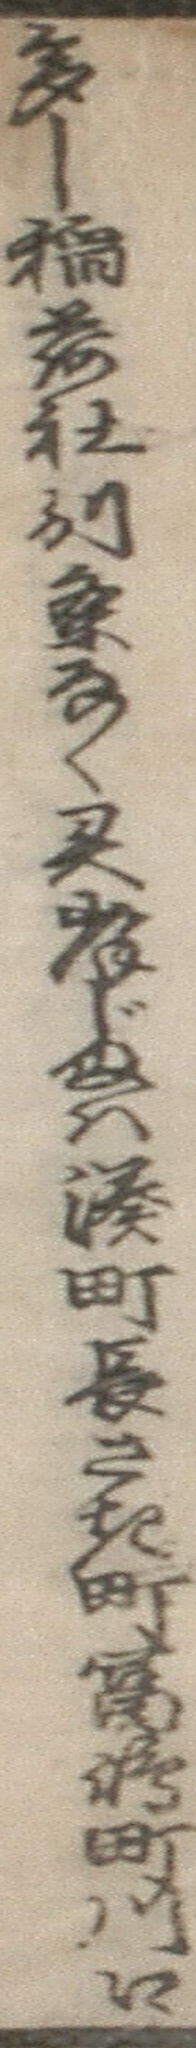多し稲荷社別条なく霊岸じまは湊町長さき町冨嶋町川口
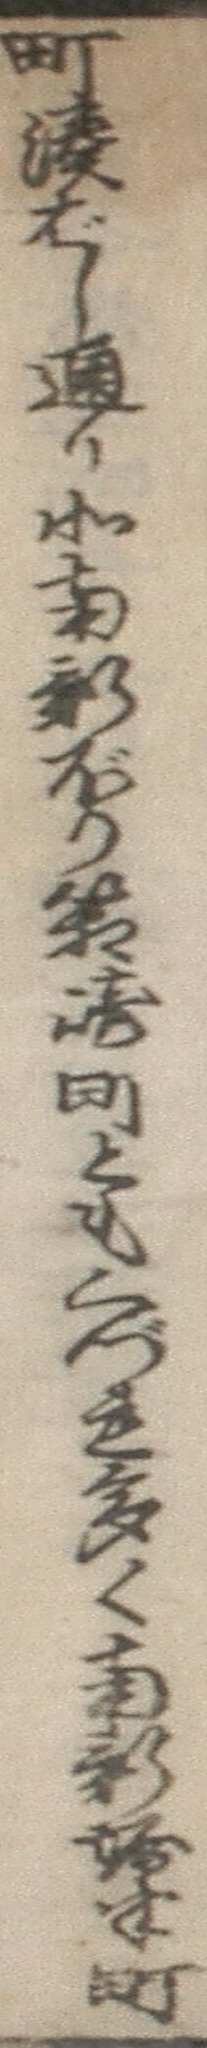町湊ばし通り北南新ぼり箱﨑町ともくづれ多く南新堀半町
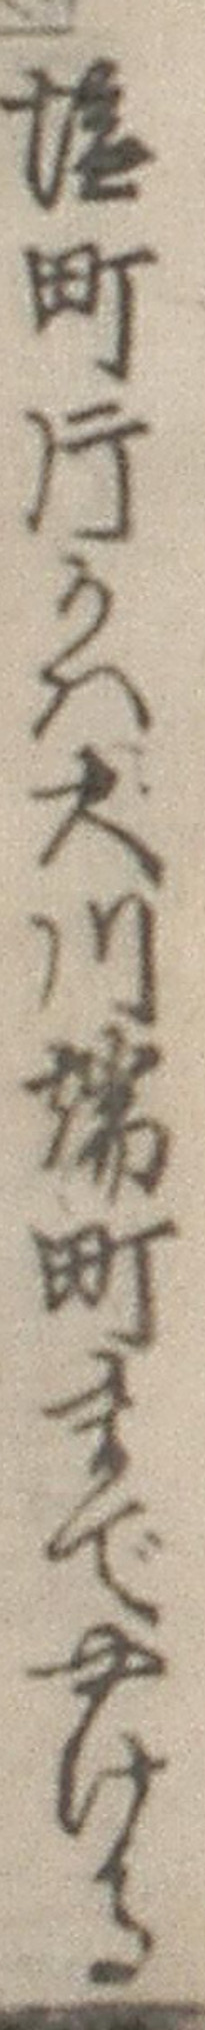塩町片かは大川端町までやける
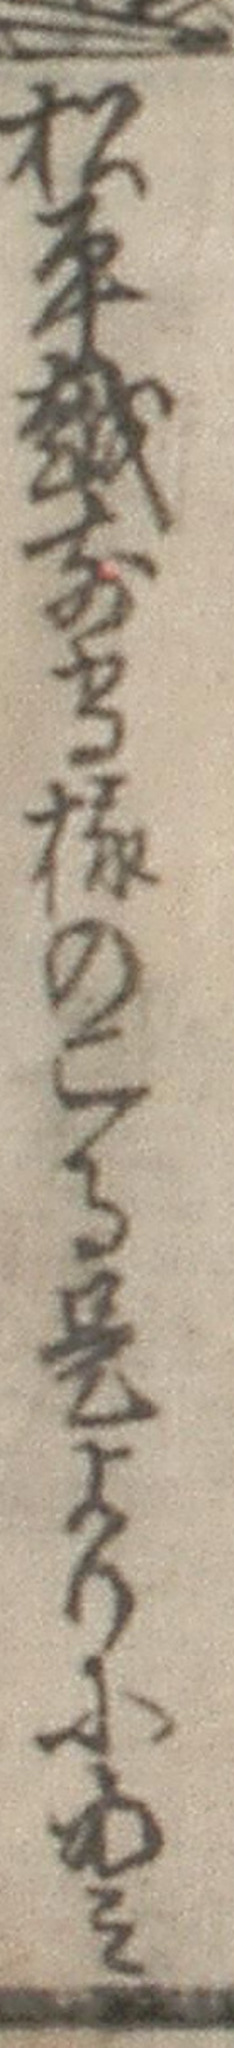松平越前守様のこる是より小あみ
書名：江戸大地震末代鑑
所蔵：東京大学地震研究所図書室 Earthquake Research Institute Library, The University of Tokyo, JAPAN
